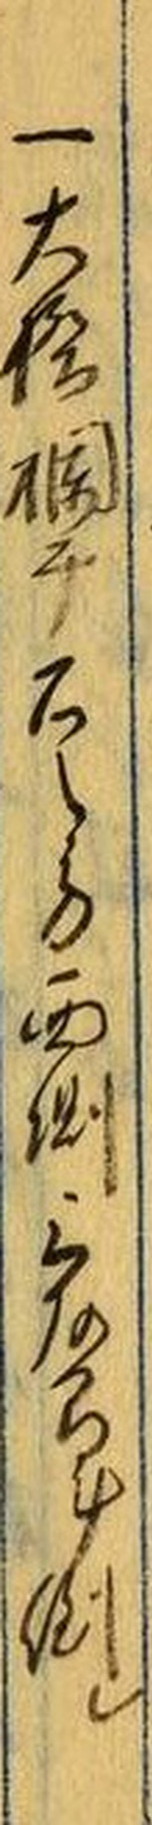一大橋欄干石之方西側三拾間斗倒レ
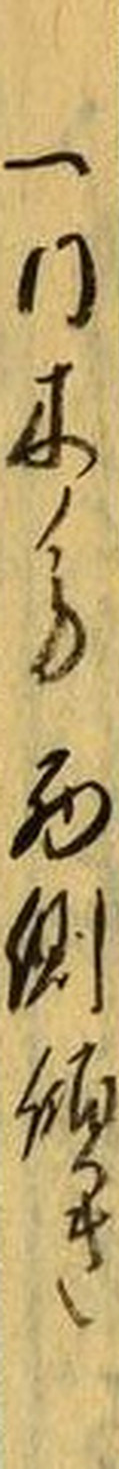一同木ノ方西側傾き
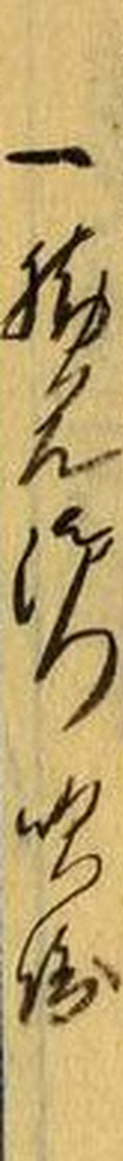一勝見御門吹倒
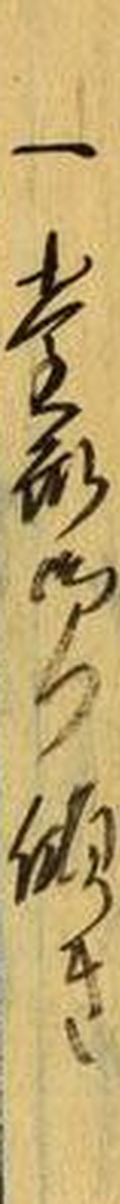一堂形御門傾き
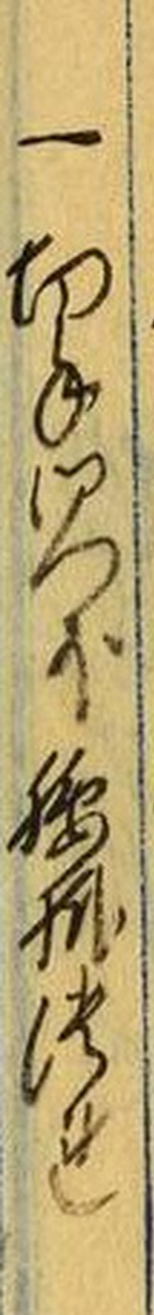一切手御門外腰掛潰れ
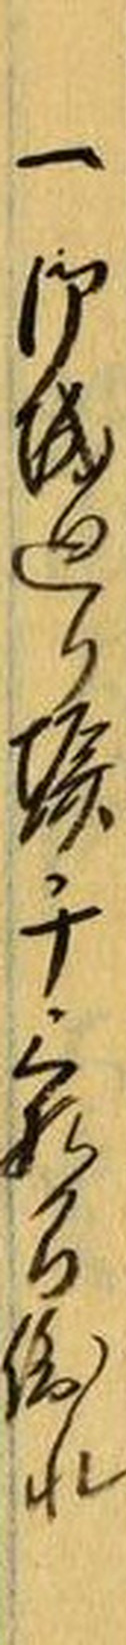一御城廻り塀千三拾間倒れ
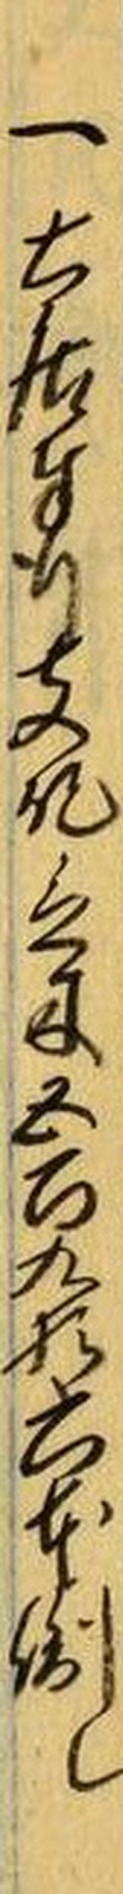一土居奉行支配立木五百九拾六本倒レ
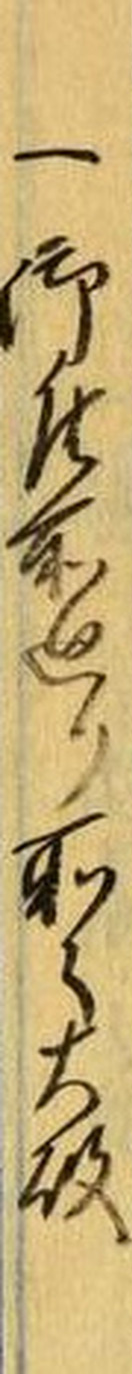一御座所廻り所々大破
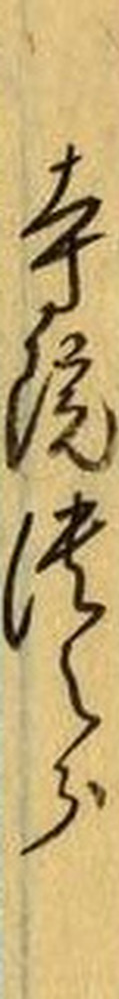寺院潰之分
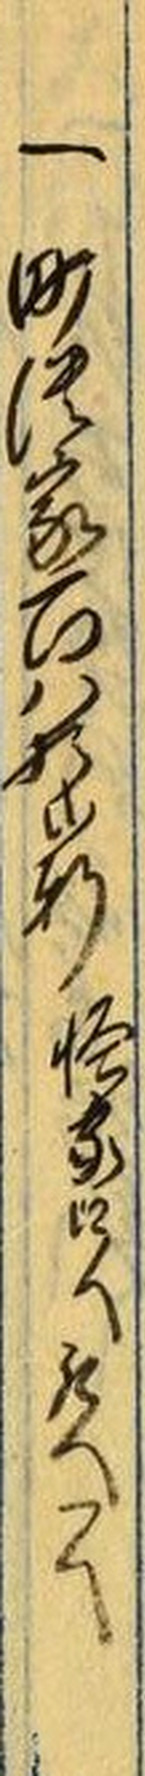一町潰家百八拾弐軒怪我人四人死人一人
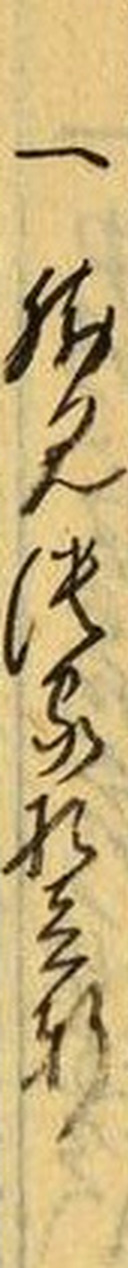一勝見潰家拾壱軒
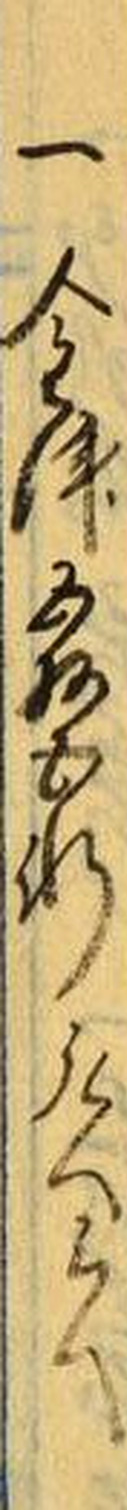一金津五拾五軒死人三人

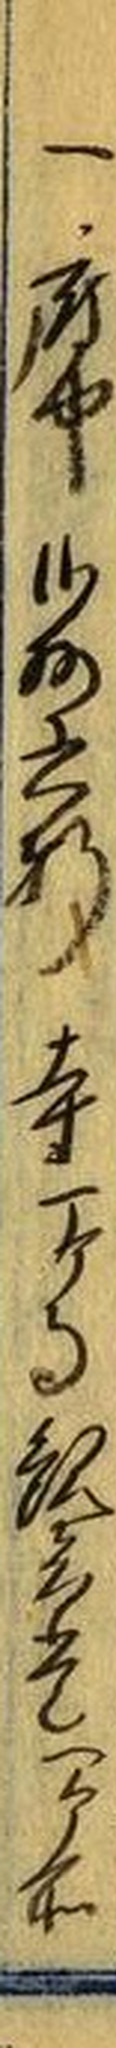一府中弐拾六軒寺一ヶ寺観音堂一ヶ所
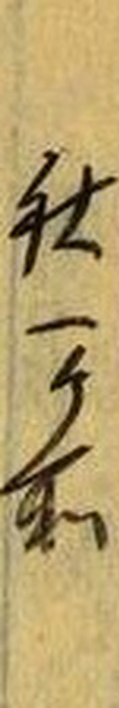社一ヶ所
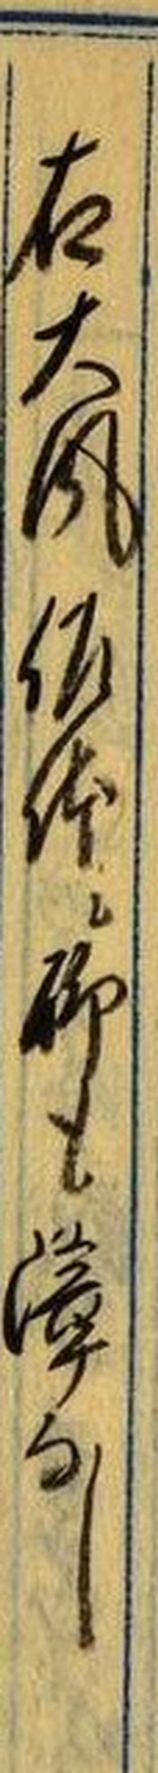右大風作体ニ聊も障なし
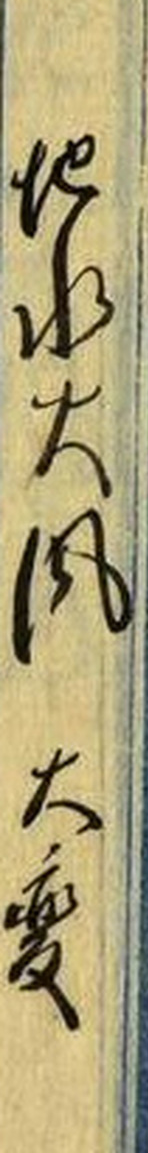地水大風大変
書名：温古集 五巻
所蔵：福井県文書館 Fukui Prefectural Archives
